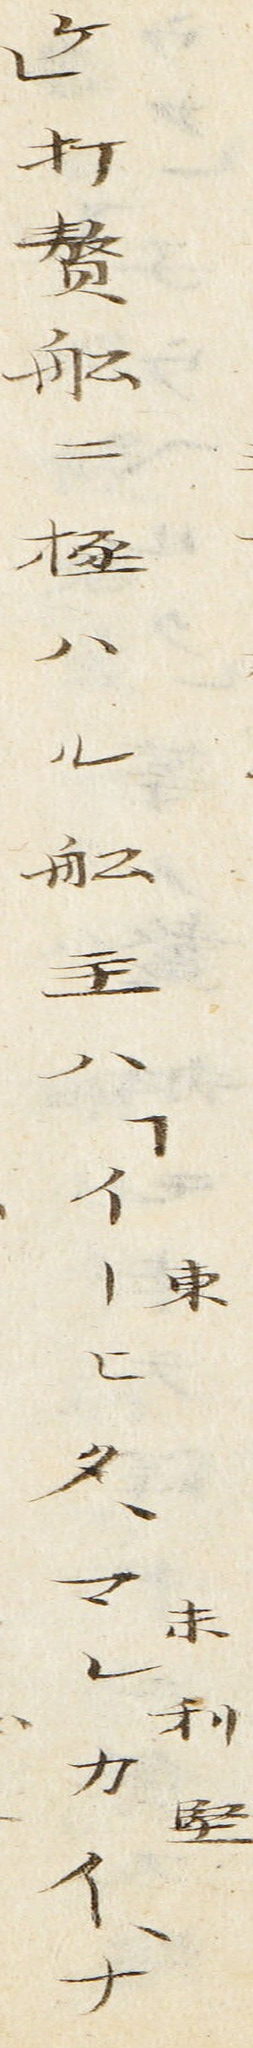ケ」打贅船ニ極ハル船主ハ「イーヒタ、マレカイ、ナ
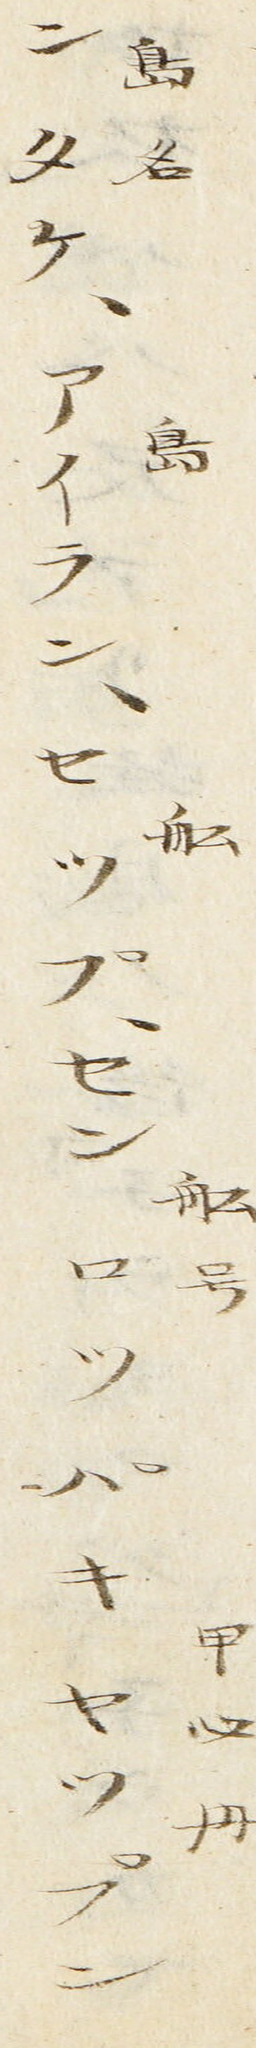ンタケ、アイラン、セツプ、センロツパキヤツプン
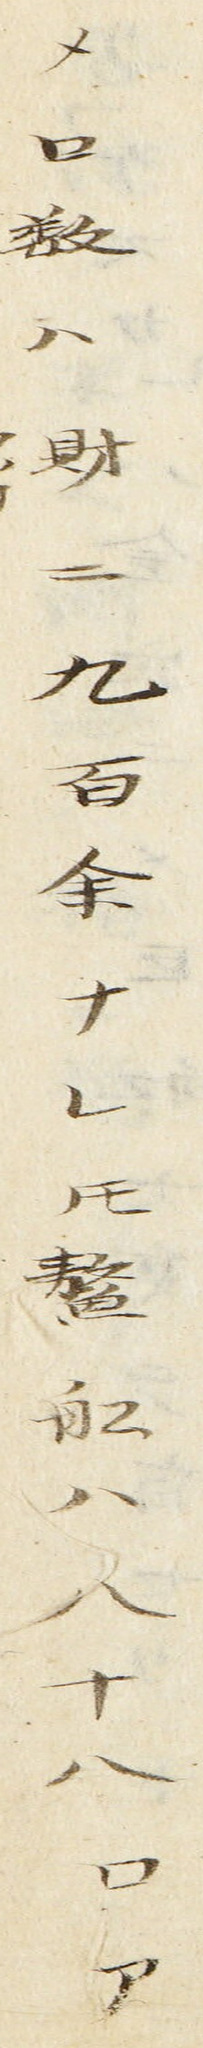シテ口数ハ財ニ九百余ナレトモ鰲船ハ八十八口ア

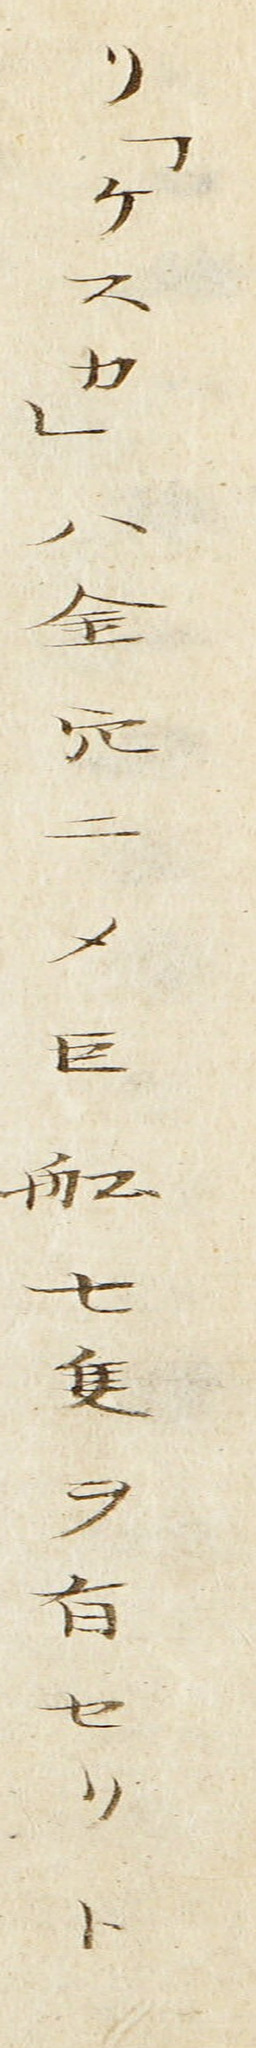リ「ケスカ」ハ金穴ニシテ巨船七隻ヲ有セリト
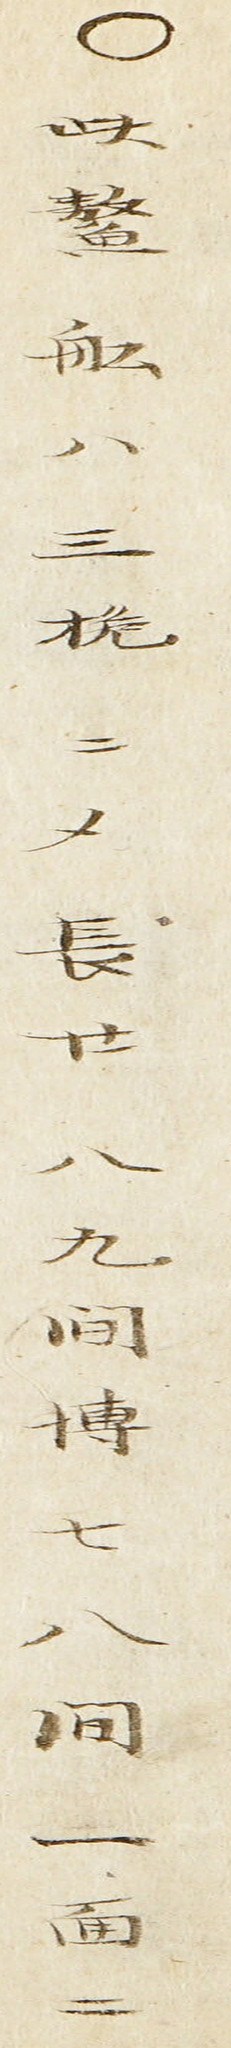○此鰲船ハ三桅ニシテ長廿八九間博七八間一面ニ
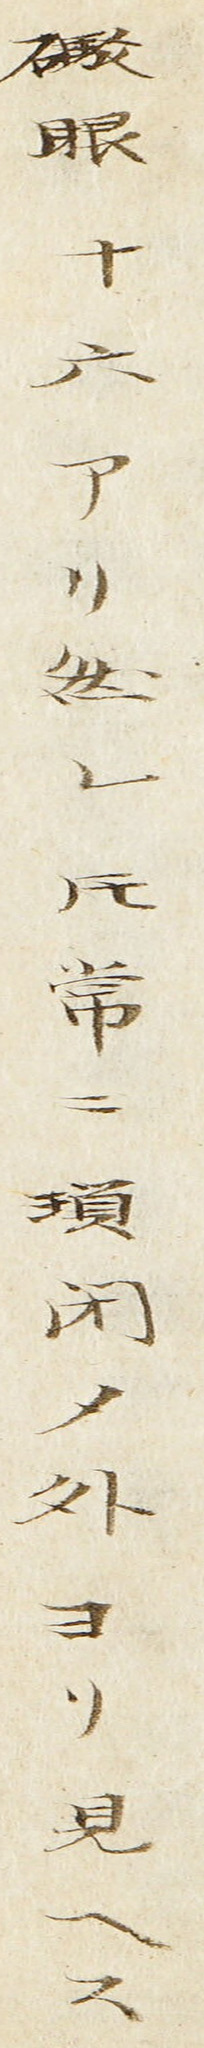礟眼十六アリ然レトモ常ニ瑣閉シテ外ヨリ見ヘス
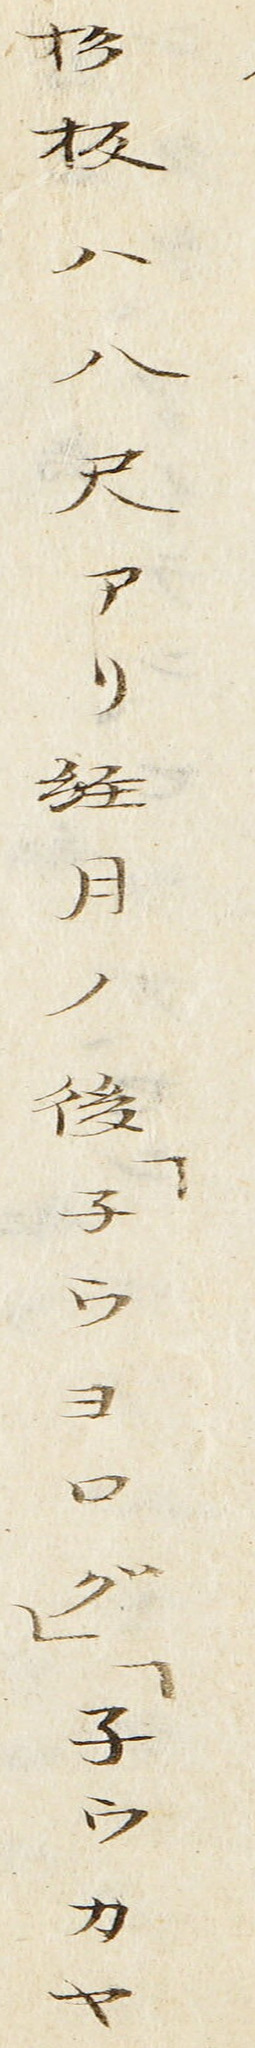杉板ハ八尺アリ経月ノ後「ネウヨログ」「ネウカヤ
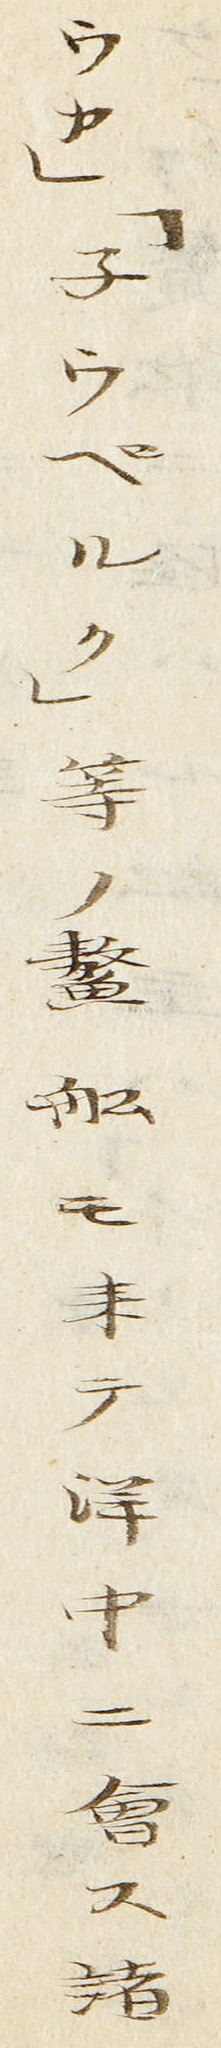ウカ」「ネウベルク」等ノ鰲船モ来テ洋中ニ会ス諸
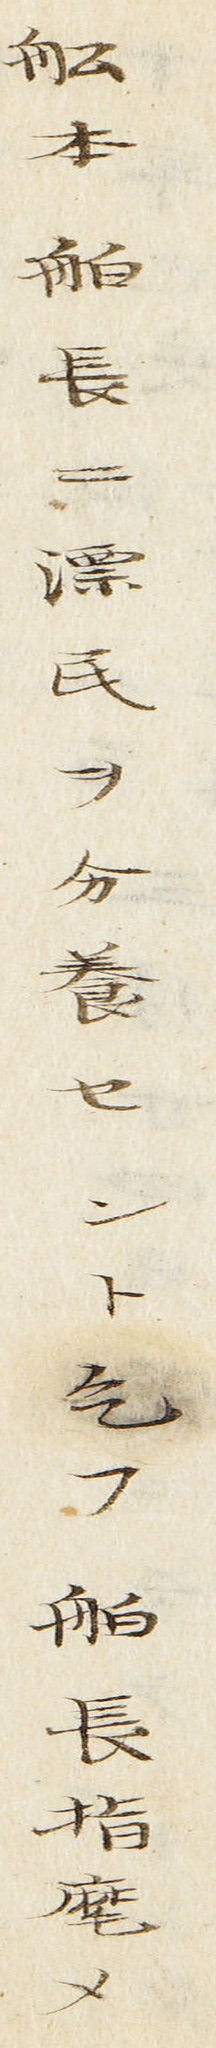船本舶長ニ漂民ヲ分養セント乞フ舶長指麾シテ
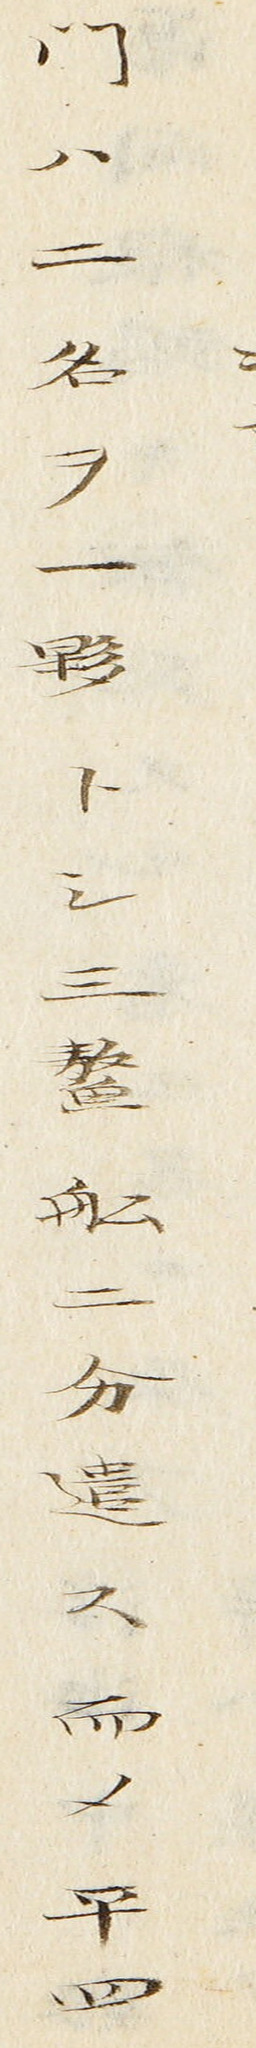門ハ二名ヲ一夥トシ三鰲船ニ分遣ス而シテ平四
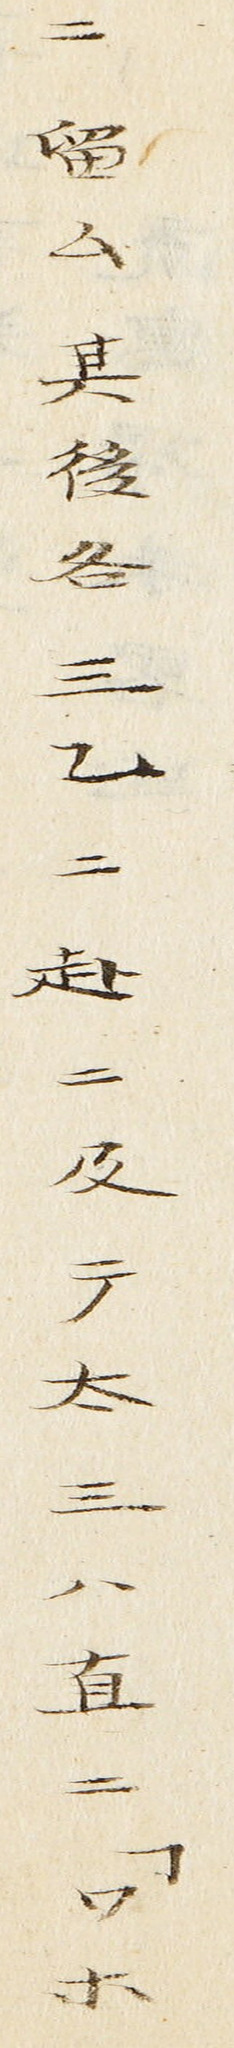ニ留ム其後各三乙ニ赴ニ及テ太三ハ直ニ「ワホ
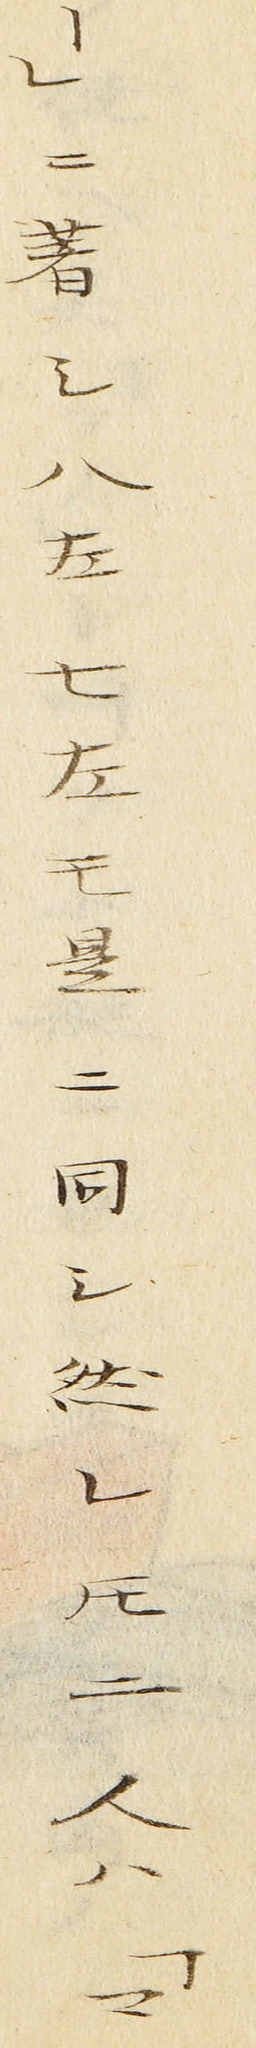ー」ニ著シ八左七左モ是ニ同シ然レトモ二人ハ「マ
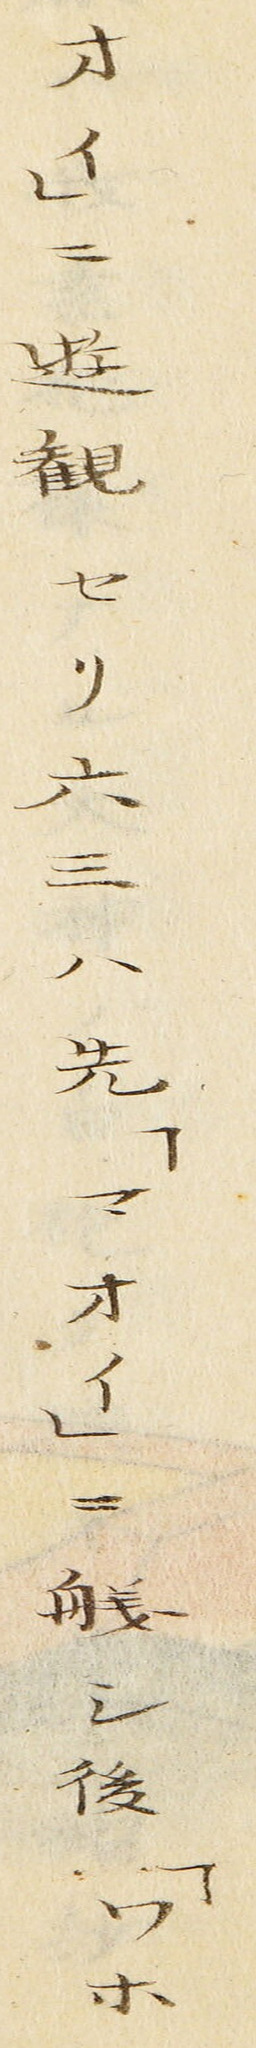オイ」ニ遊観セリ六三ハ先「マオイ」ニ艤シ後「ワホ
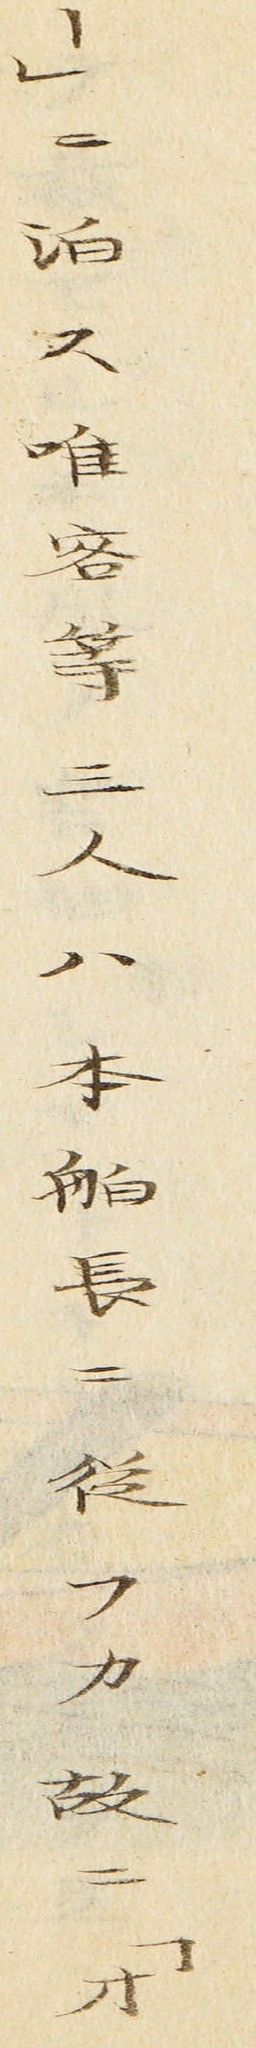ー」ニ泊ス唯客等三人ハ本舶長ニ従フカ故ニ「オ
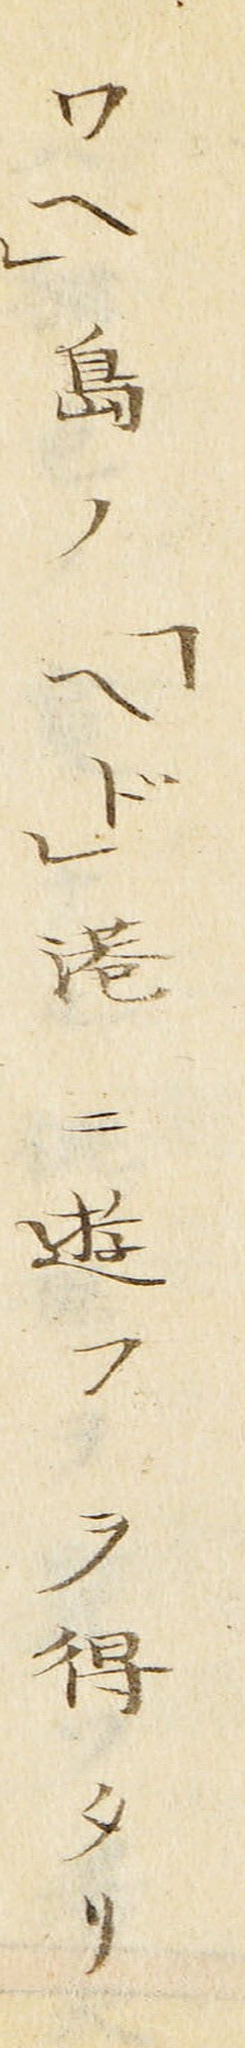ワヘ」島ノ「ヘド」港ニ遊フヲ得タリ
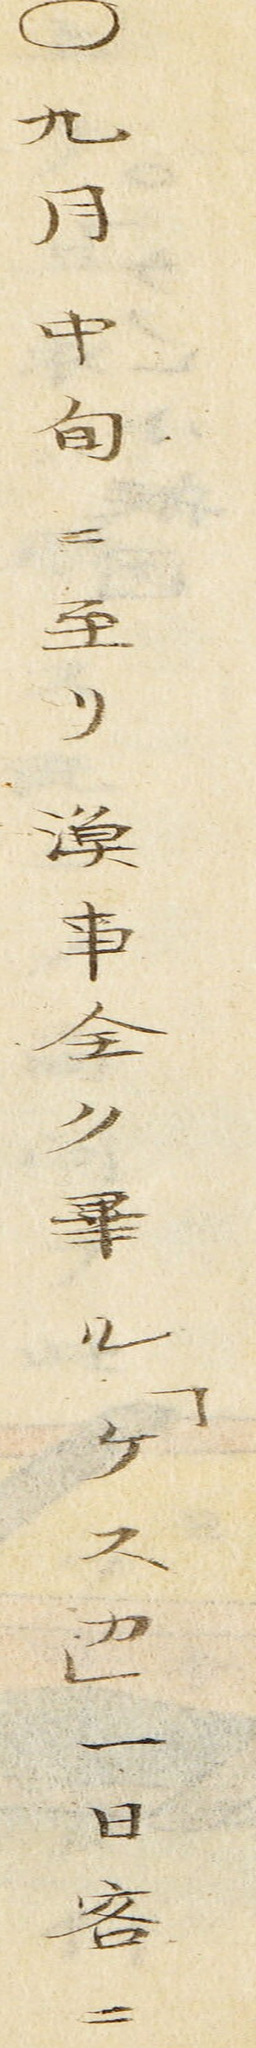○九月中旬ニ至リ漁事全ク畢ル「ケスカ」一日客ニ
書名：流蕃通書
